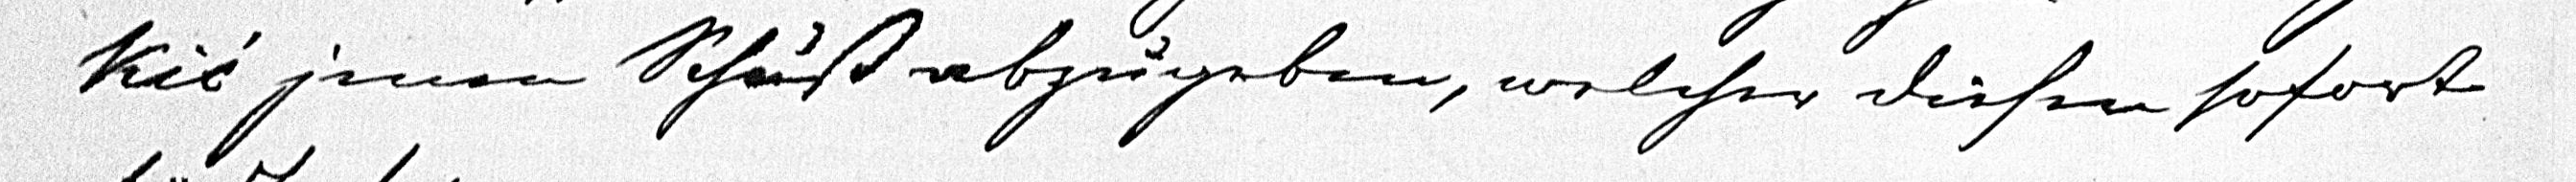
kić jenen Schuß abzugeben, welcher diesen sofort
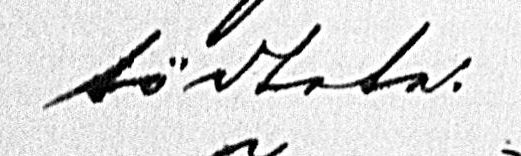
tödtete.
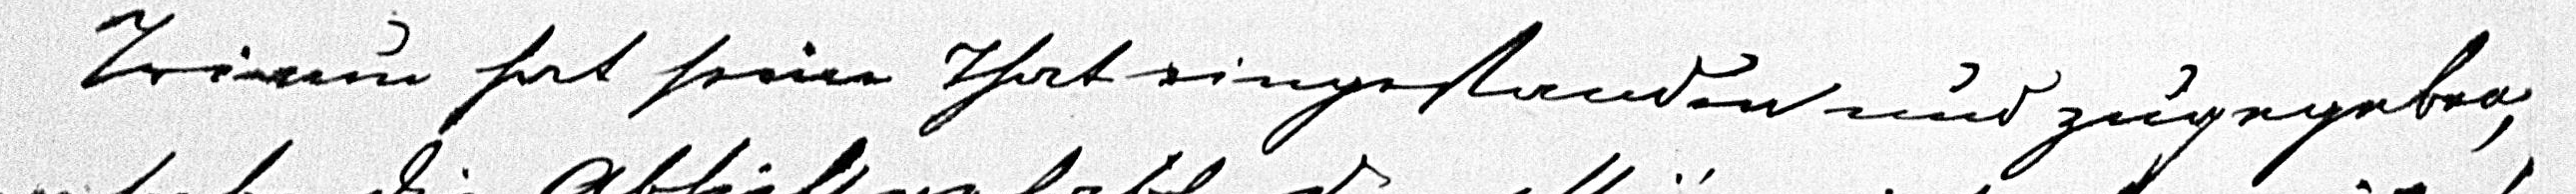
Trivun hat seine That eingestanden und zugegeben,
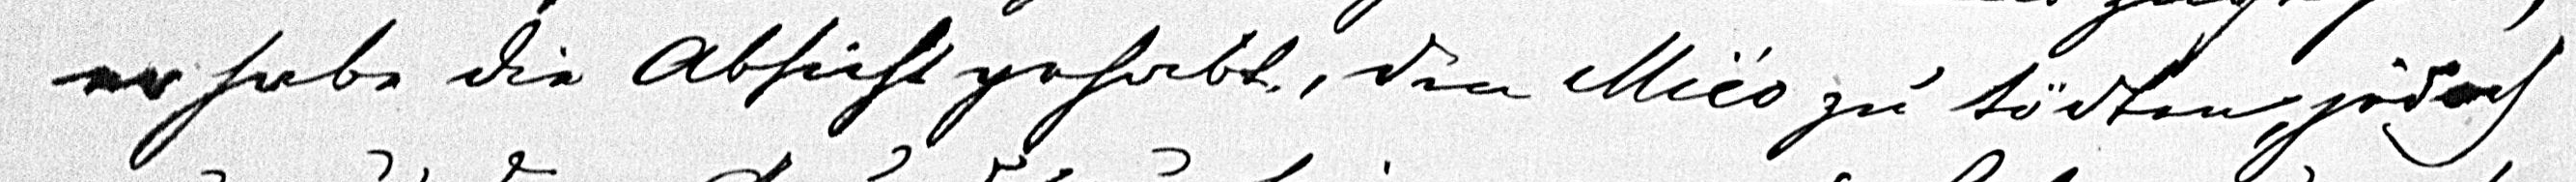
er habe die Absicht gehabt, den Mićo zu tödten, jedoch
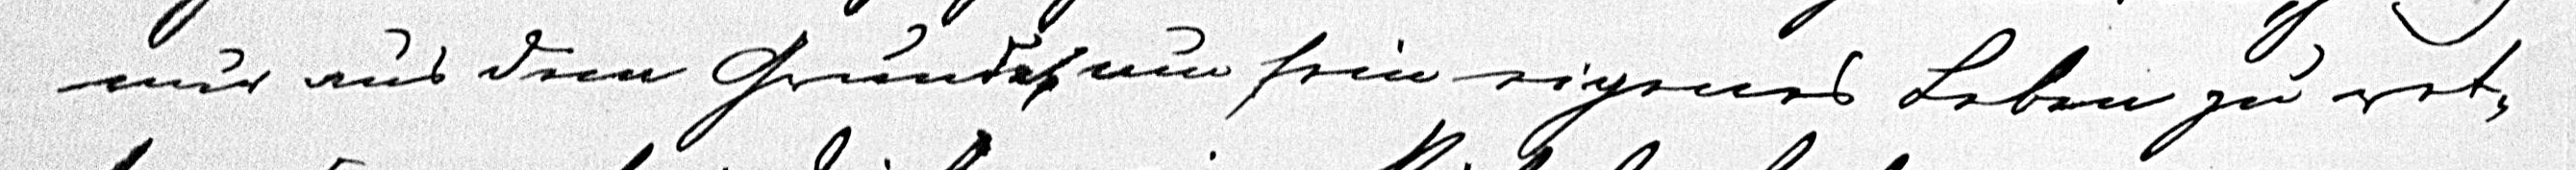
nur aus dem Grundes um sein eigenes Leben zu ret¬
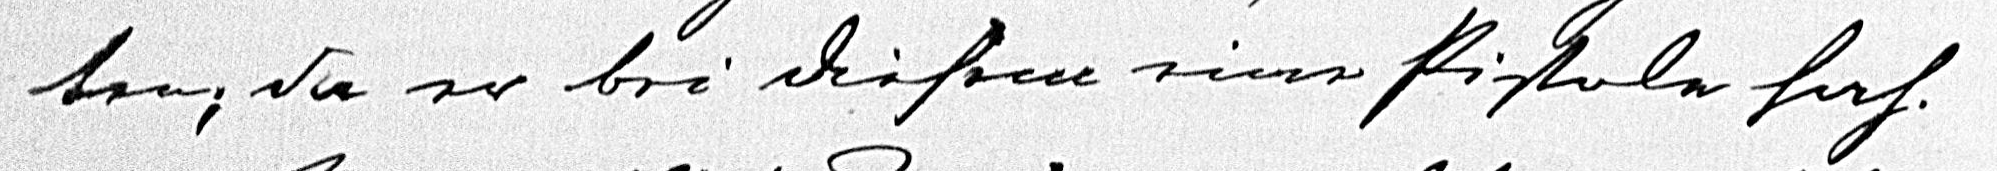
ten; da er bei diese eine Pistole sah.
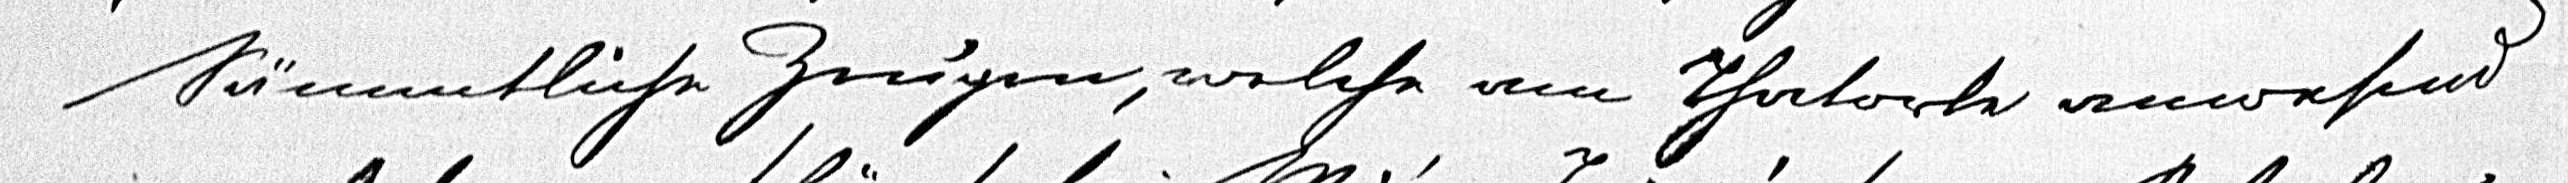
Sämmtliche Zeugen, welche am Thatorte anwesend
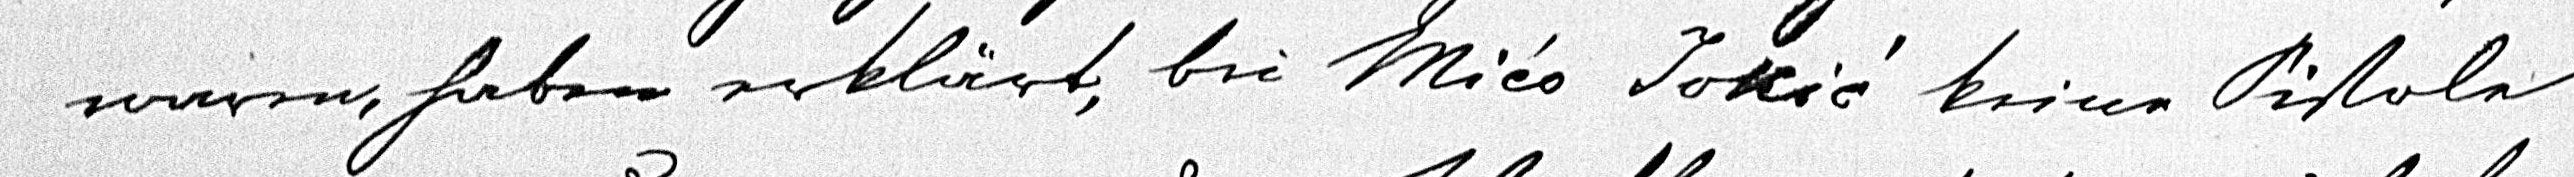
waren, haben erklärt, bei Mićo Jokić keine Sistole
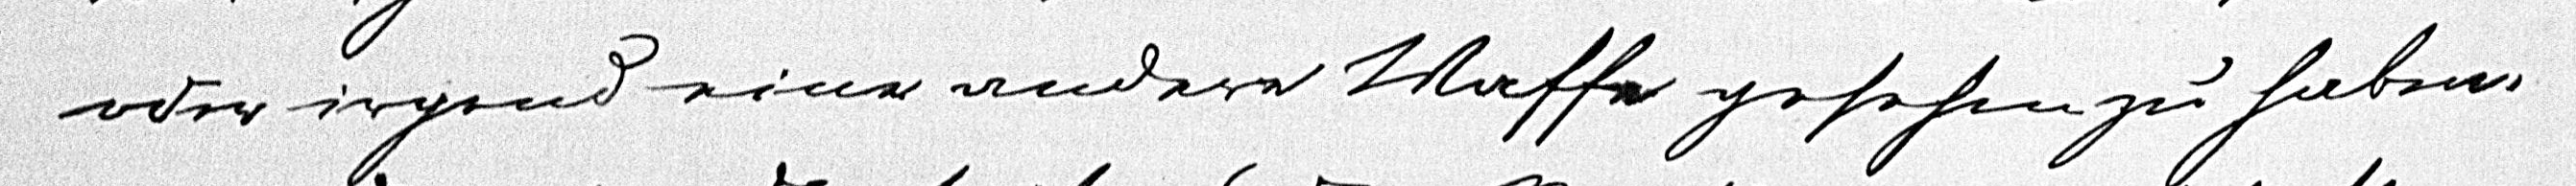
oder irgend eine andere Waffe gesehen zu haben.
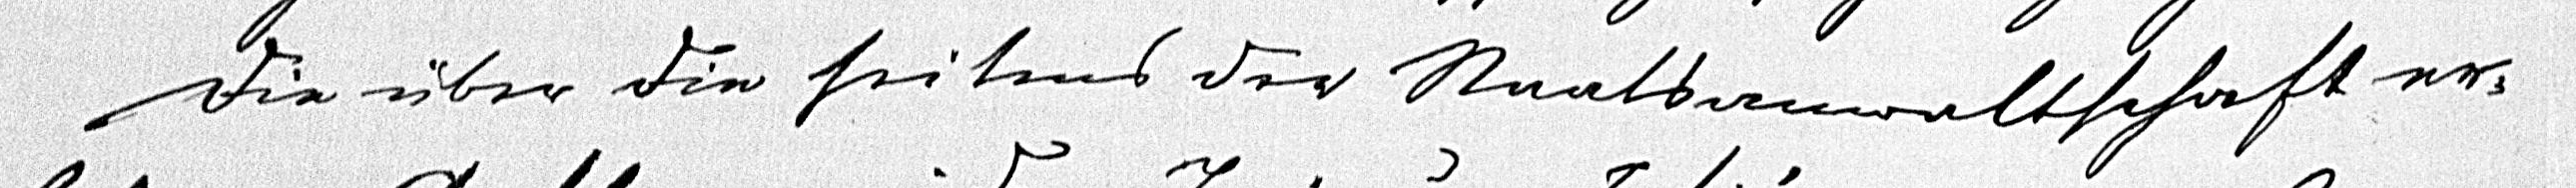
Die über die seitens der Staatsanwaltschaft er¬
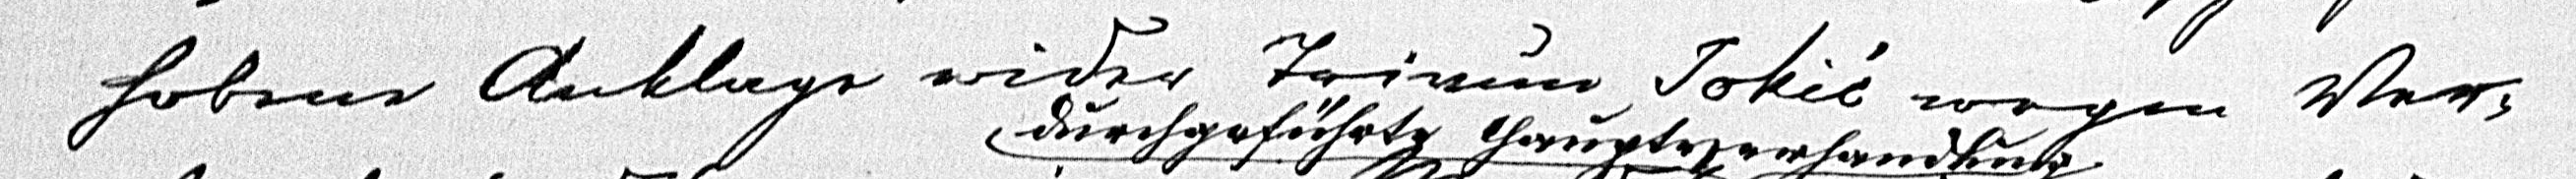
hobene Anklage wider Trivun Jokić wegen Ver¬
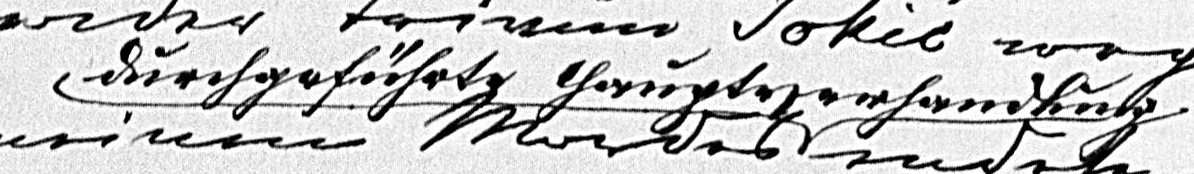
durchgeführte Hauptverhandlung
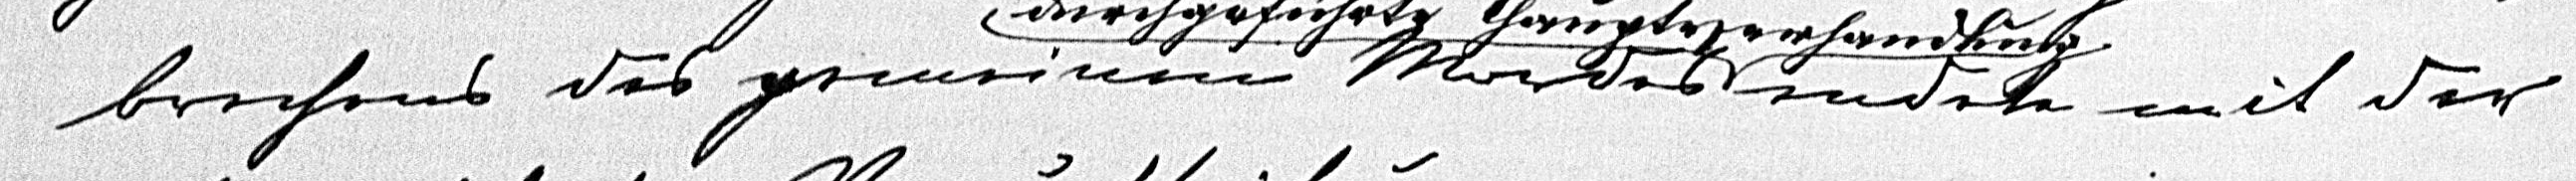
brechens des gemeinen Mordes xxden mit der
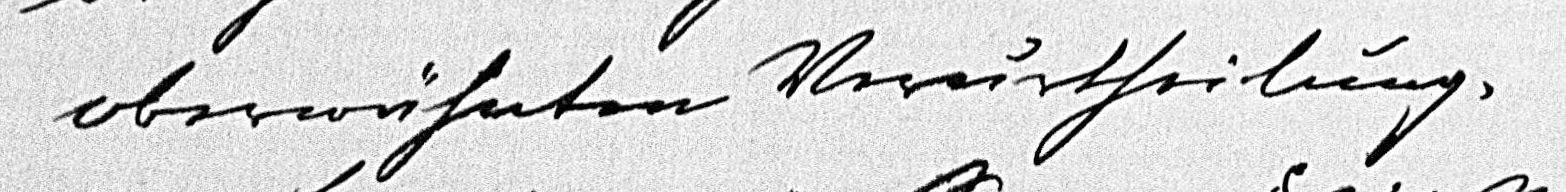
oberwährten Verurtheilung.
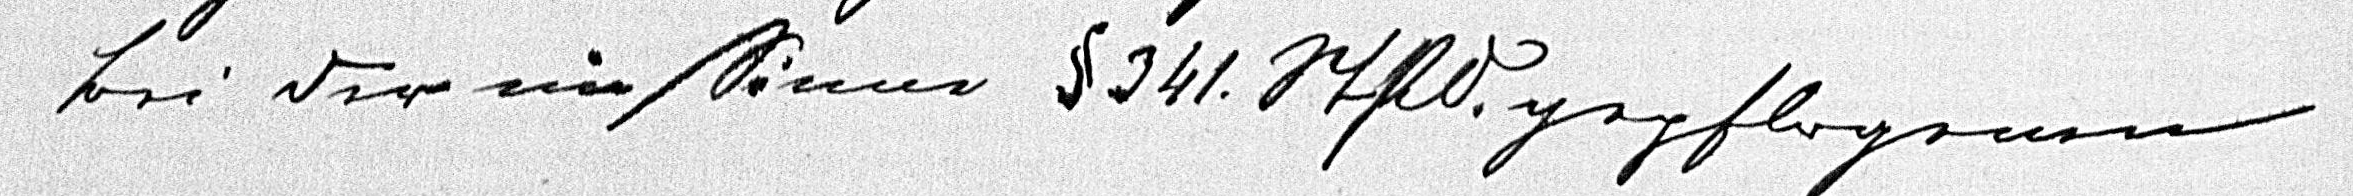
Bei der ein Sinne § 341. Stxx. gepflogenen
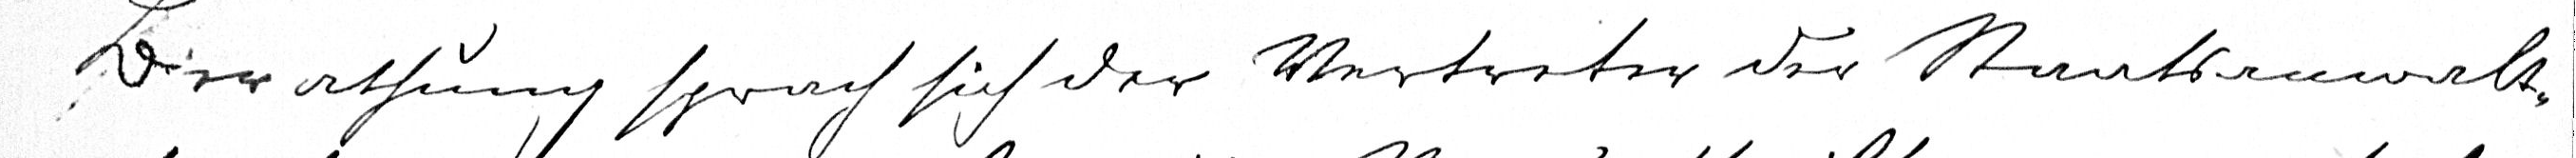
Berathung sprach sich der Vertreter der Staatsanwalt¬
